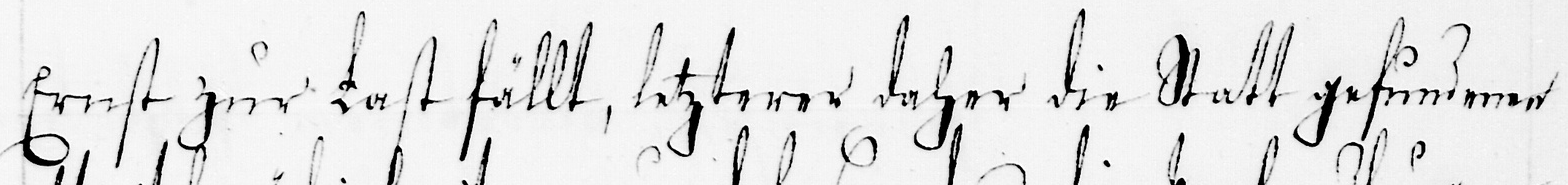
Ernst zur Last fällt, letzterer daher die Statt gefundenen
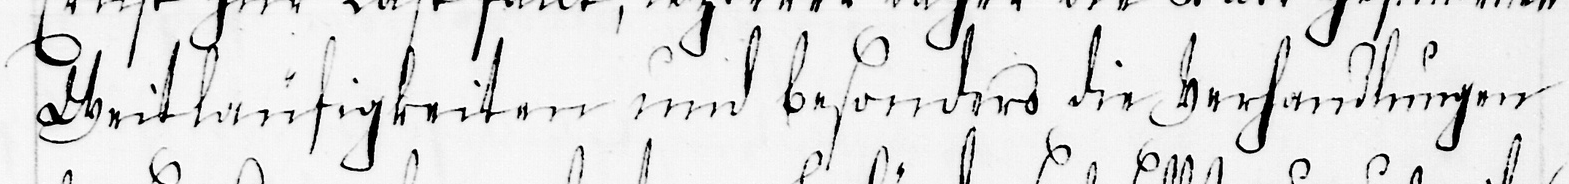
Weitläufigkeiten und besonders die Verhandlungen
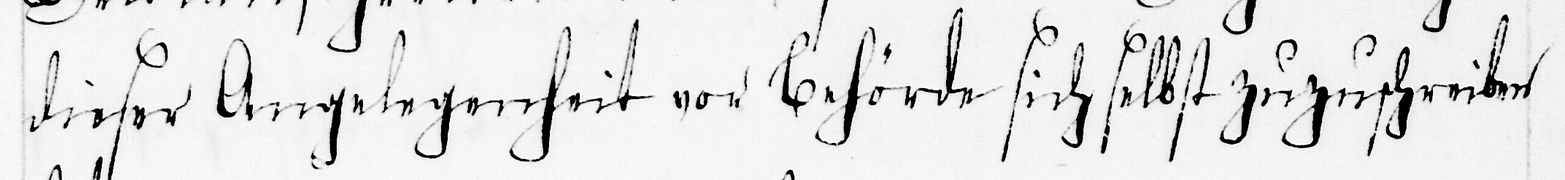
dieser Angelegenheit vor Behörde sich selbst zuzuschreiben
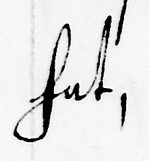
hat,
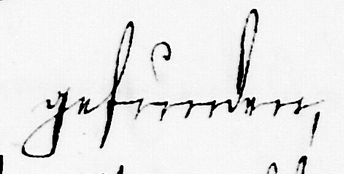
gefunden,
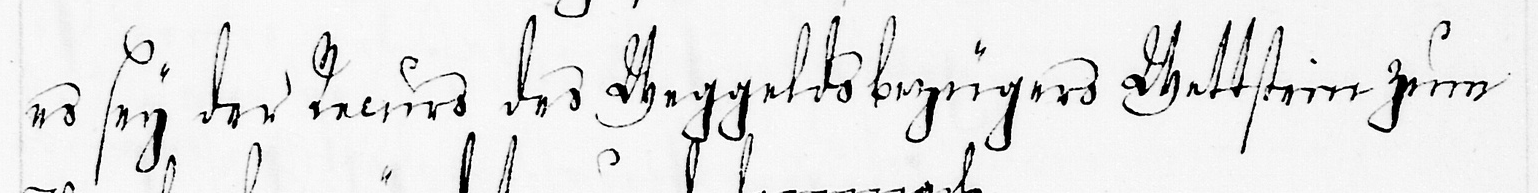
es sey der Recurs des Weggeldbezügers Wettstein zum
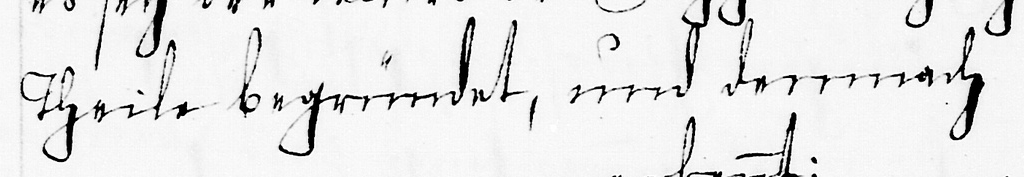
Theile begründet, und demnach
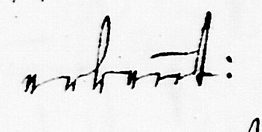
erkennt:
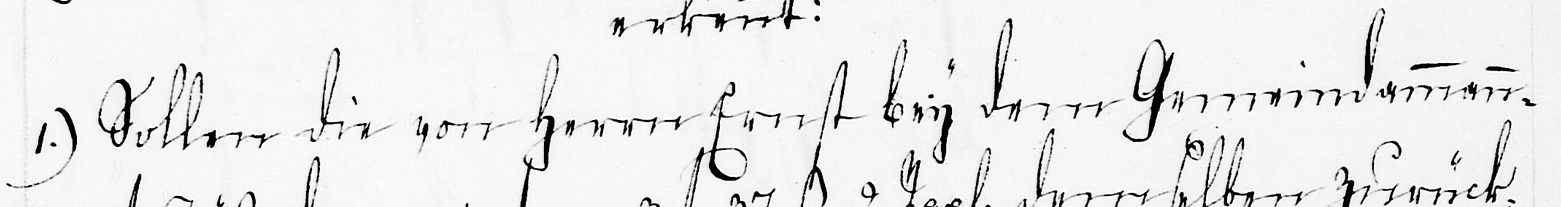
1.) Sollen die von Herrn Ernst bey dem Gemeindeammann¬
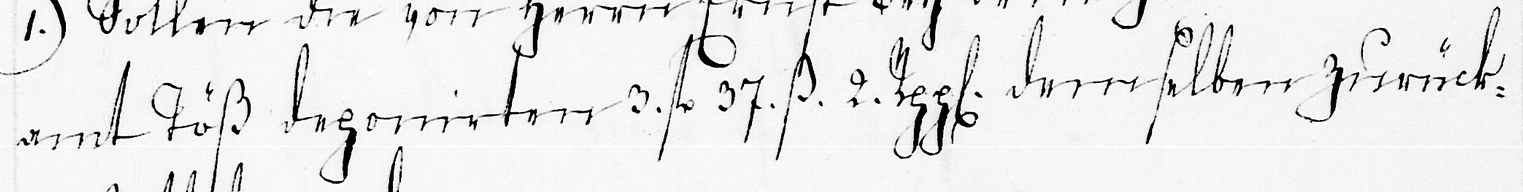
amt Töß deponirten 3. fl. 37. ß. 2. Rpp[en]. demselben zurück¬
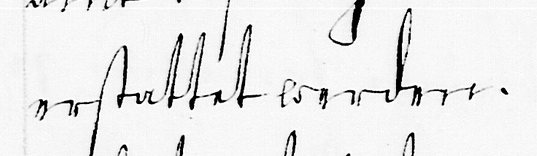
erstattet werden.
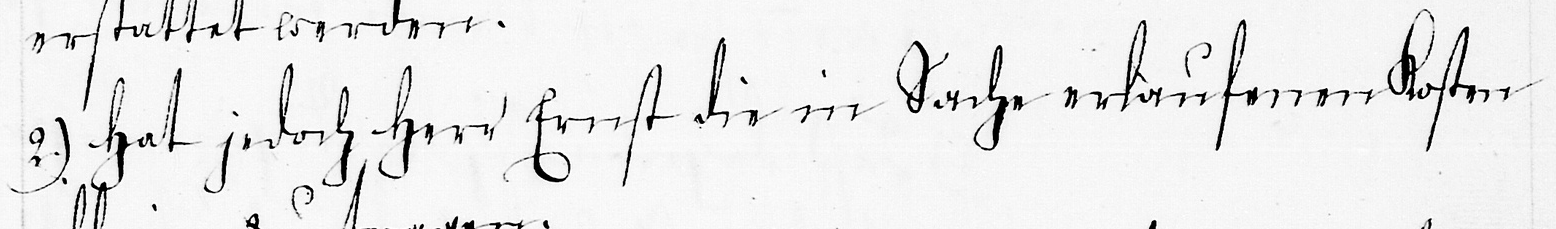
2.) Hat jedoch Herr Ernst die in Sache erlaufenen Kosten
